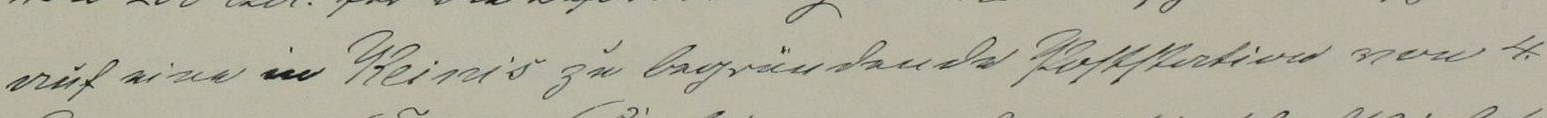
auf eine in Keinis zu begründende Poststation von 4.
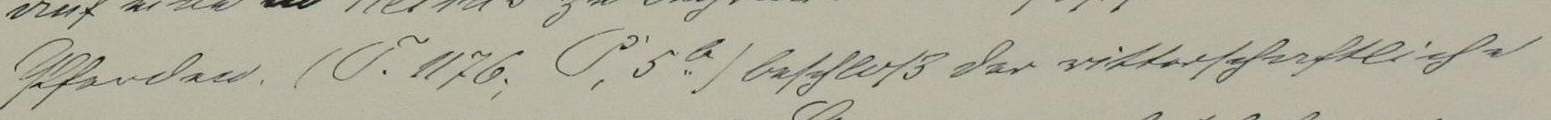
Pferden. (T.1176; P.5b) beschloß der ritterschaftliche
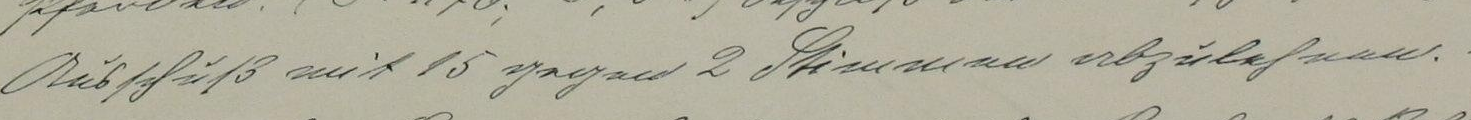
Ausschuß mit 15 gegen 2 Stimmen abzulehnen.
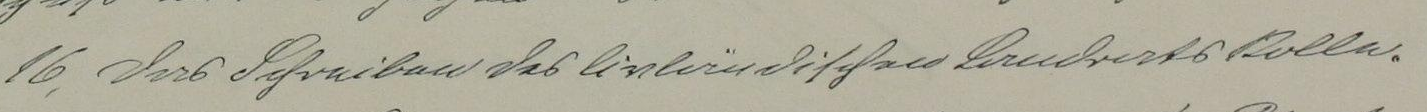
16. Das Schreiben des livländischen Landratskolle-
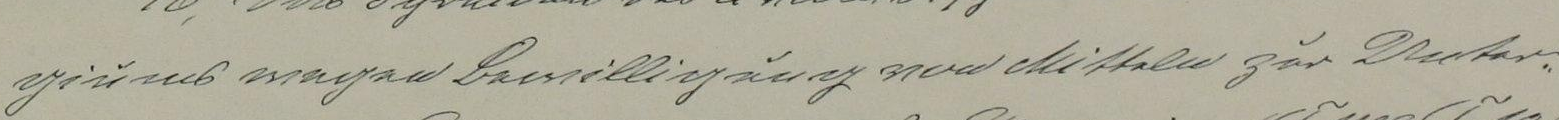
giums wegen Bewilligung von Mitteln zur Unter-
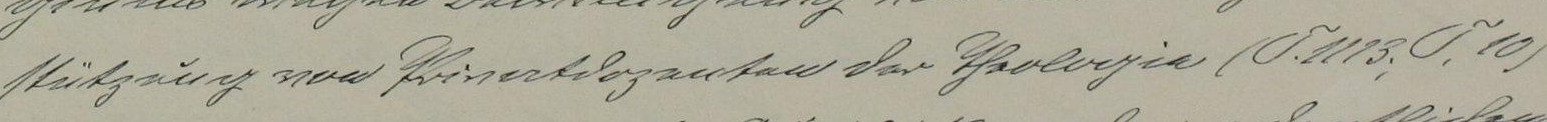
stützung von Privatdozenten der Theologie (T.1113; T.10)
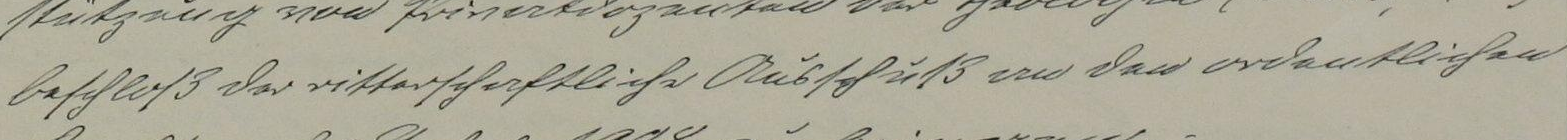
beschloß der ritterschaftliche Ausschuß an den ordentlichen
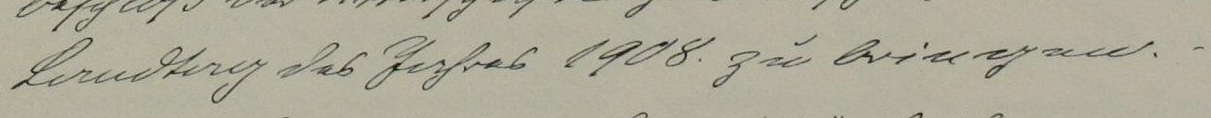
Landtag des Jahres 1908. zu bringen.
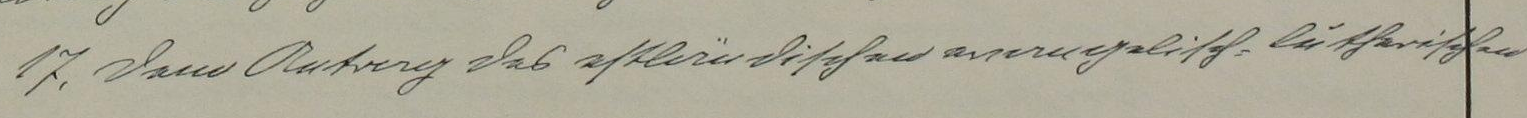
17. Dem Antrag des estländischen evangelisch-lutherischen
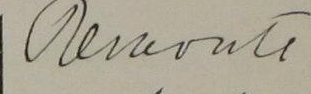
Remonte
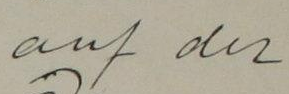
auf der
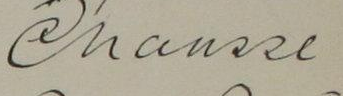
Chausse
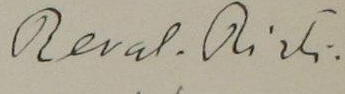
Reval-Risti
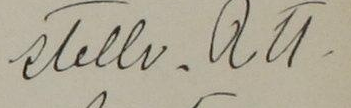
stellv. Ritt
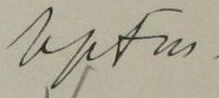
hptm
